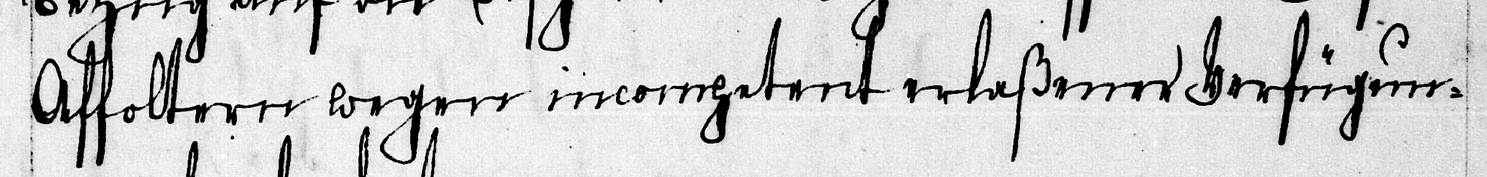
Affoltern wegen incompetent erlaßener Verfügun¬
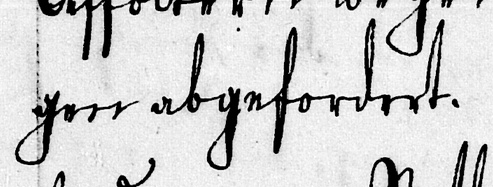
gen abgefordert.
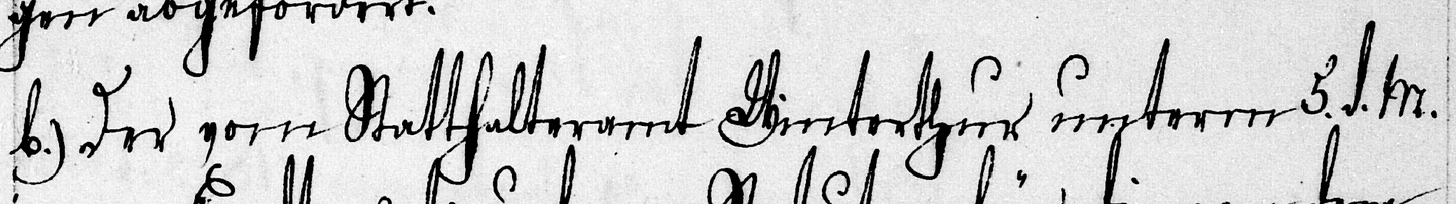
b.) Der vom Statthalteramt Winterthur unterm 5. d. M.
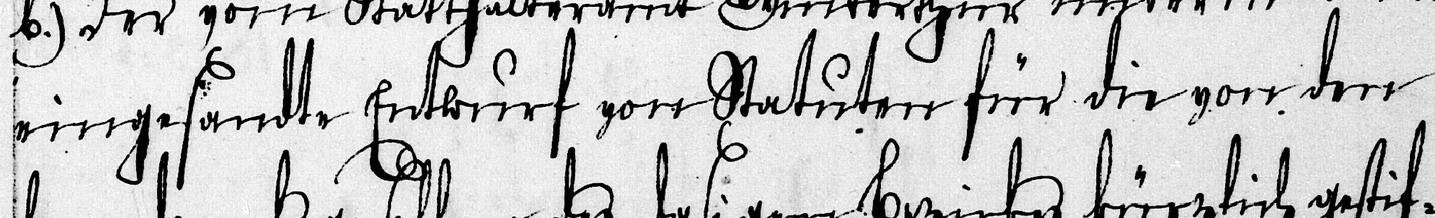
eingesandte Entwurf von Statuten für die von den
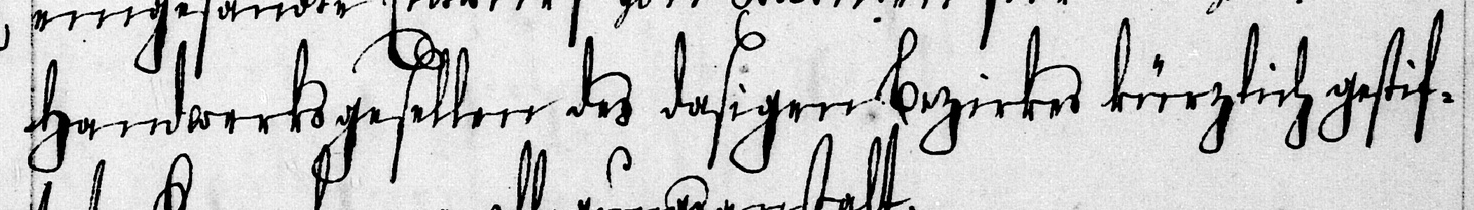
Handwerksgesellen des dasigen Bezirkes kürzlich gestif¬
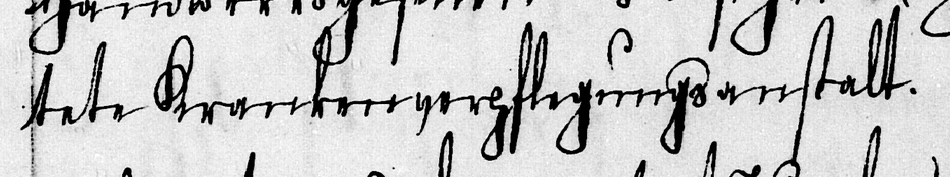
tete Krankenverpflegungsanstalt.
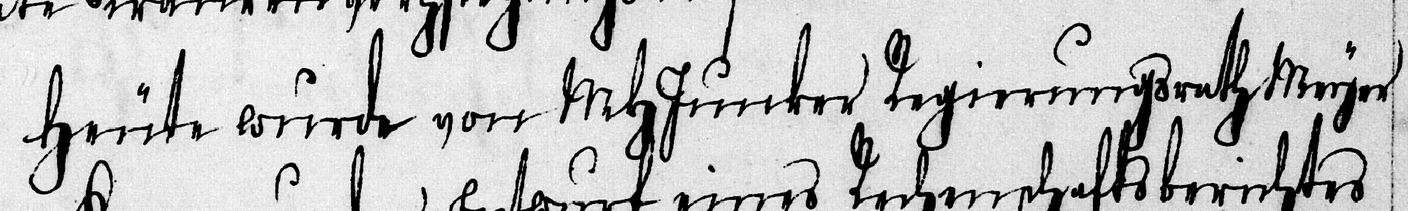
Heute wurde von MHJunker Regierungsrath Meyer
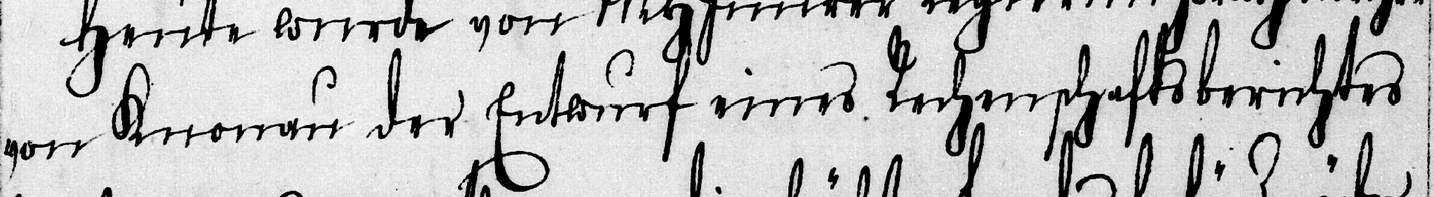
von Knonau der Entwurf eines Rechenschaftsberichtes
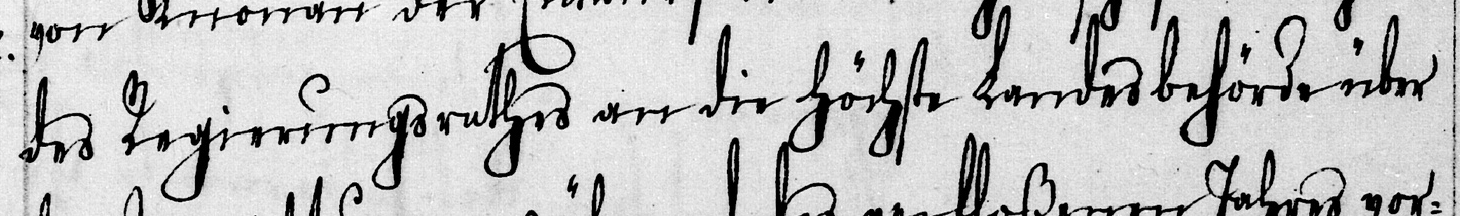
des Regierungsrathes an die Höchste Landesbehörde über
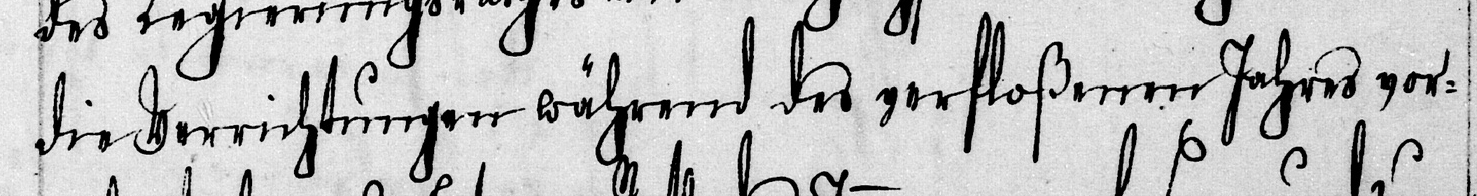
die Verrichtungen während des verfloßenen Jahres vorg¬
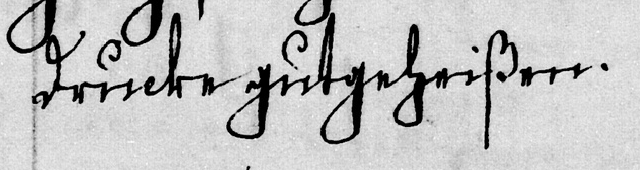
Drucke gutgeheißen.
